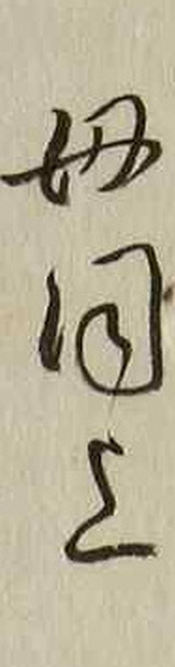母同上
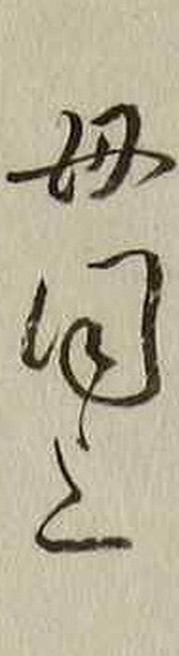母同上
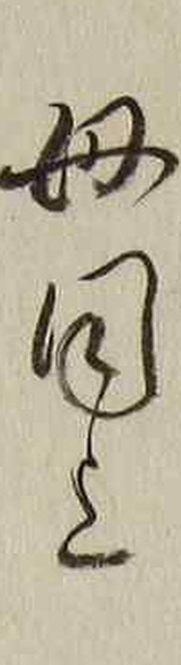母同上
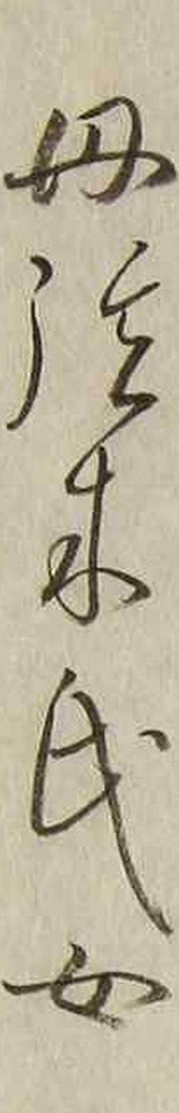母弦木氏女

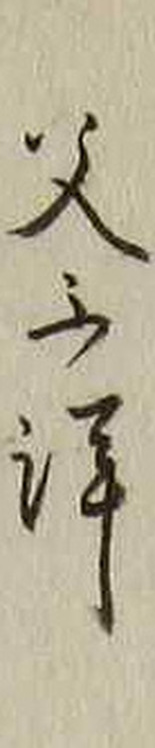父不詳
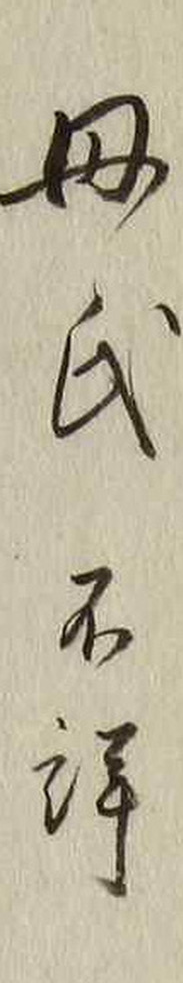母氏不詳
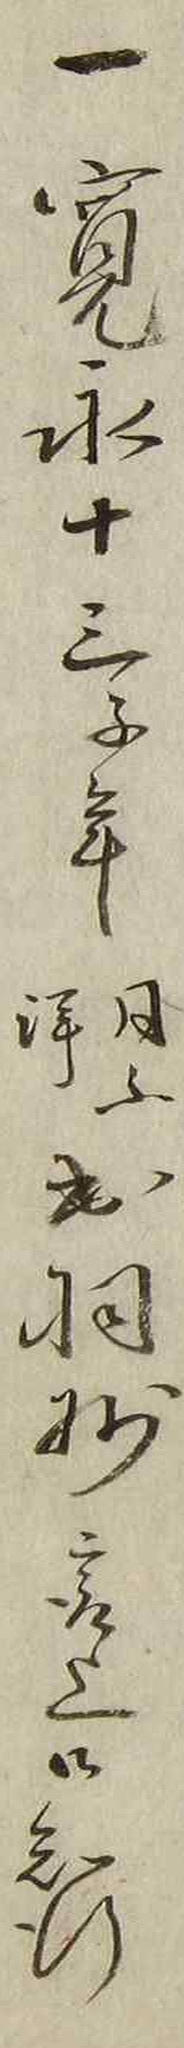一寛永十三子年月不詳出羽州最上御知行
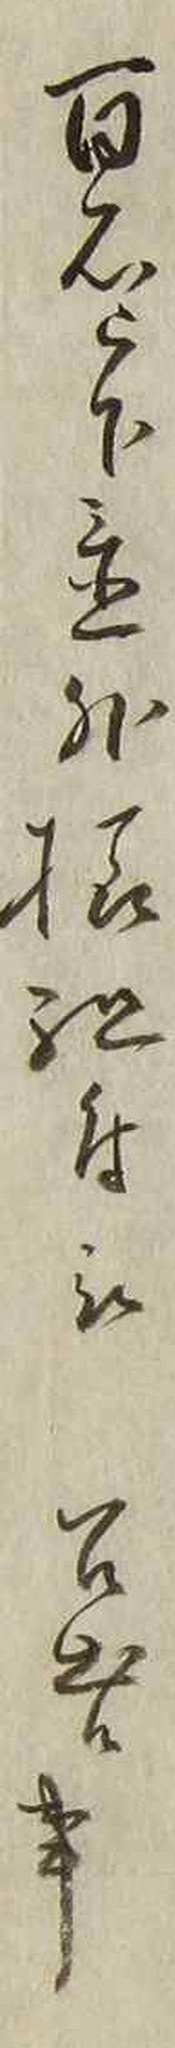百石被下置外様組付被召出候事

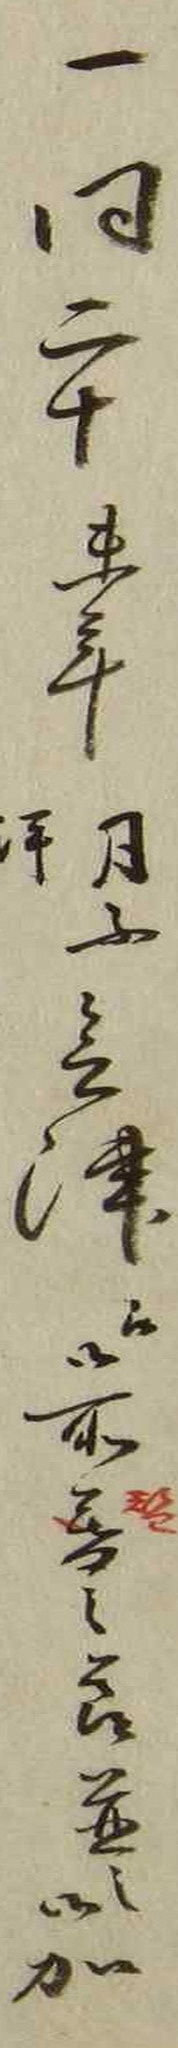一同二十未年月不詳会津江御取普之節並の御加
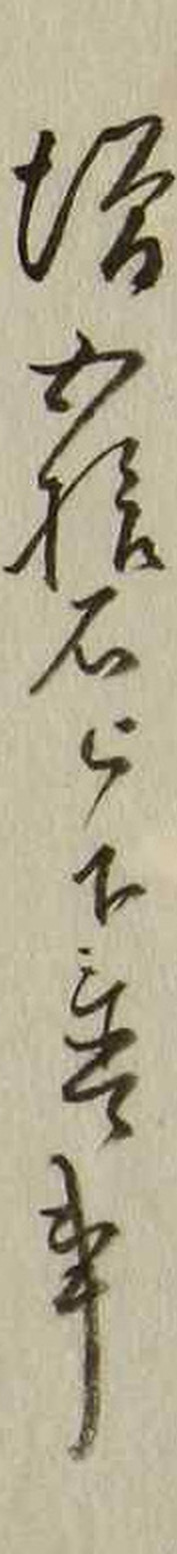増五拾石被下置候事
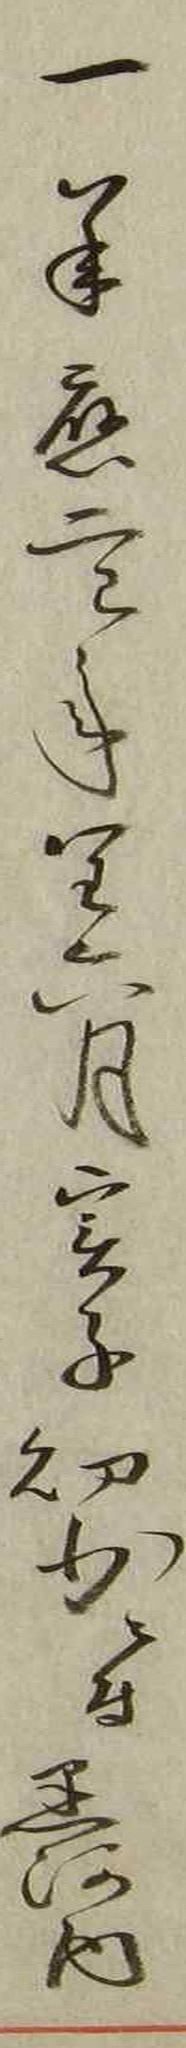一承応二巳年閏六月実子幼少に付黒河内
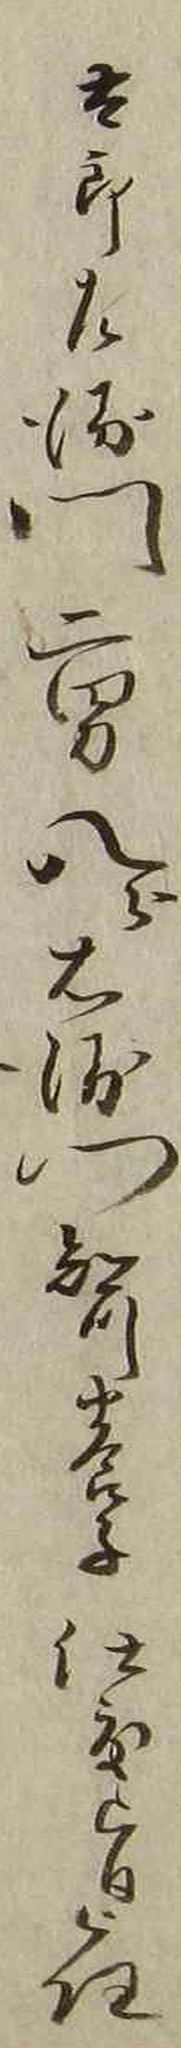太郎左衛門二男八郎右衛門婿養子仕度旨被任
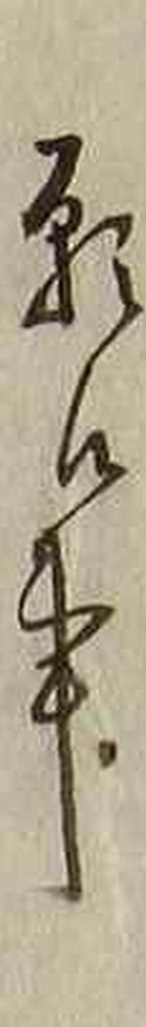願候事
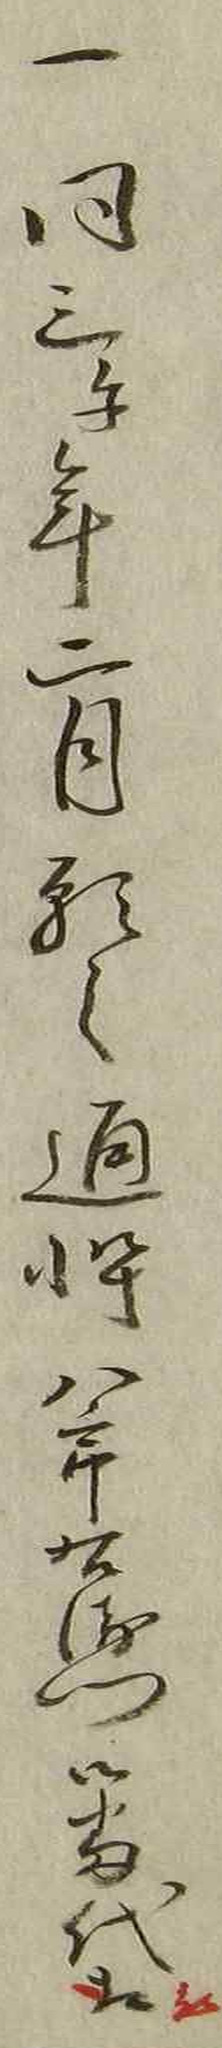一同三午年二月願之通忰八郎右衛門御番代左
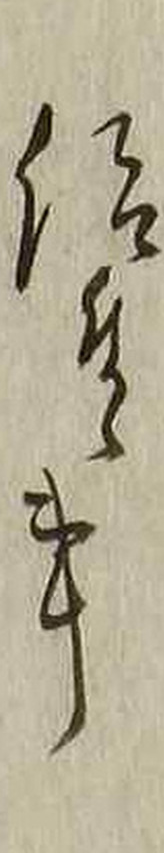仰付候事
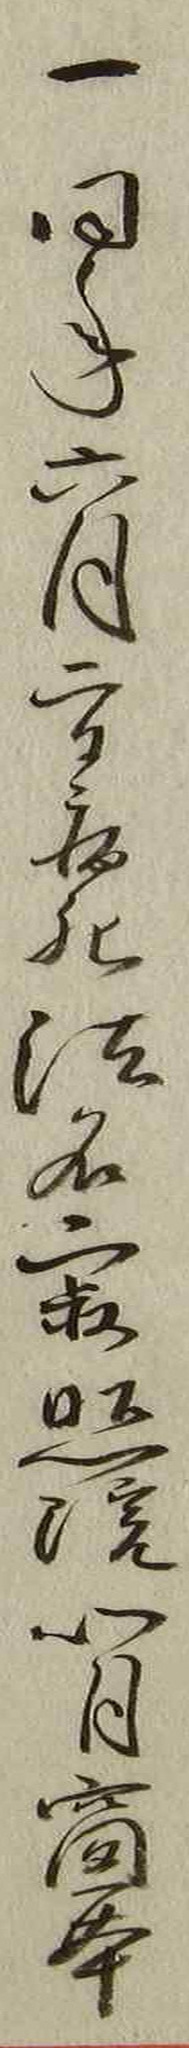一同年六月二日病死法名寂照院背窓本
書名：諸士系譜　巻之6　い之部6
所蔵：会津若松市立会津図書館
